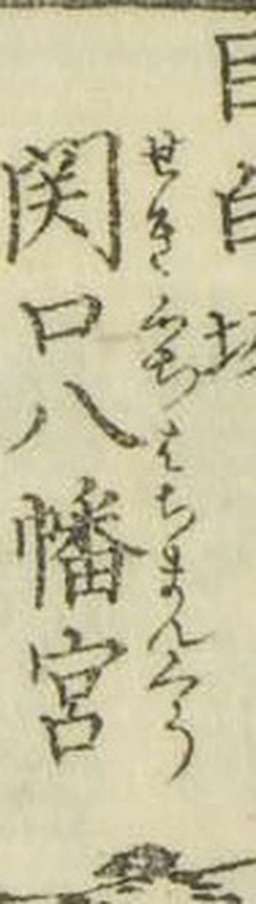関口八幡宮
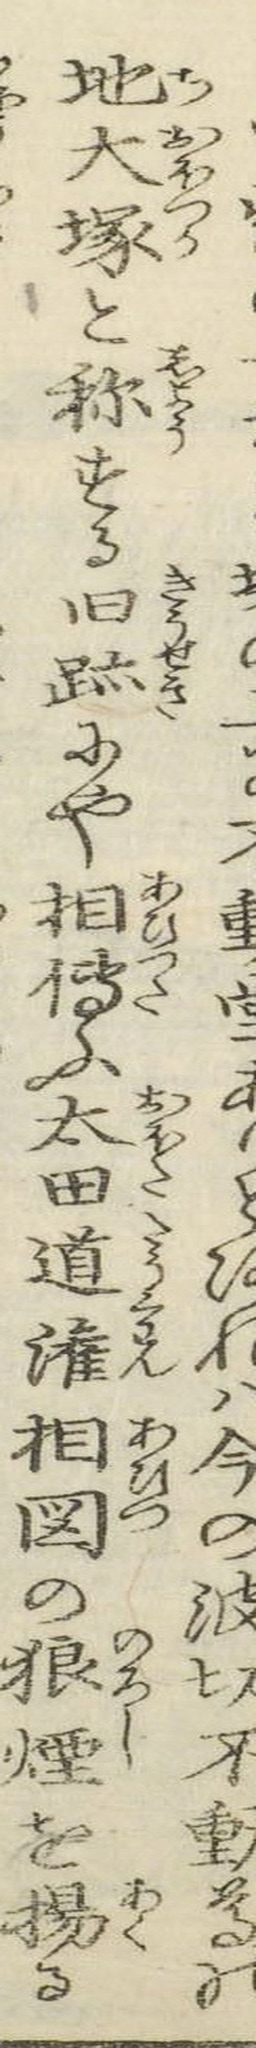地大塚と称する旧跡にや相傳ふ太田道灌相図の狼煙を揚る
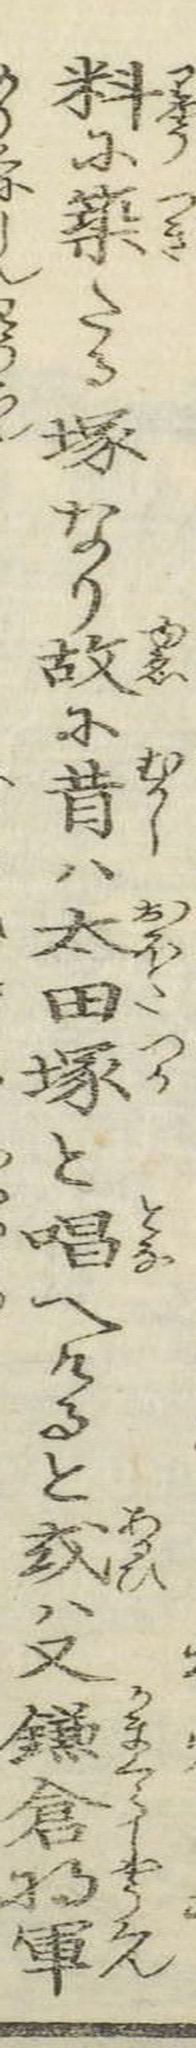料に築たる塚なり故に昔は太田塚と唱へけると或は又鎌倉将軍
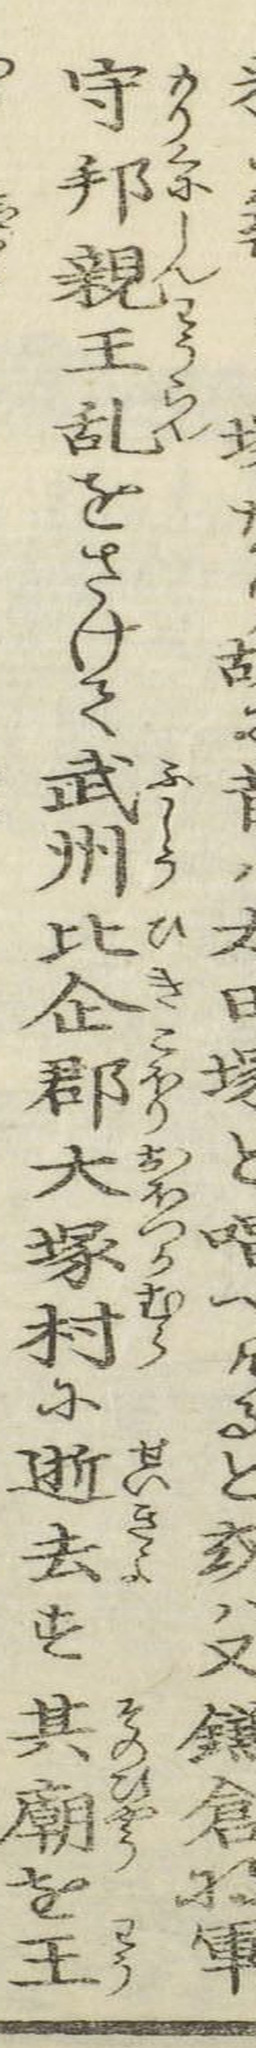守邦親王乱をさけて武州比企郡大塚村に逝去す其廟を王
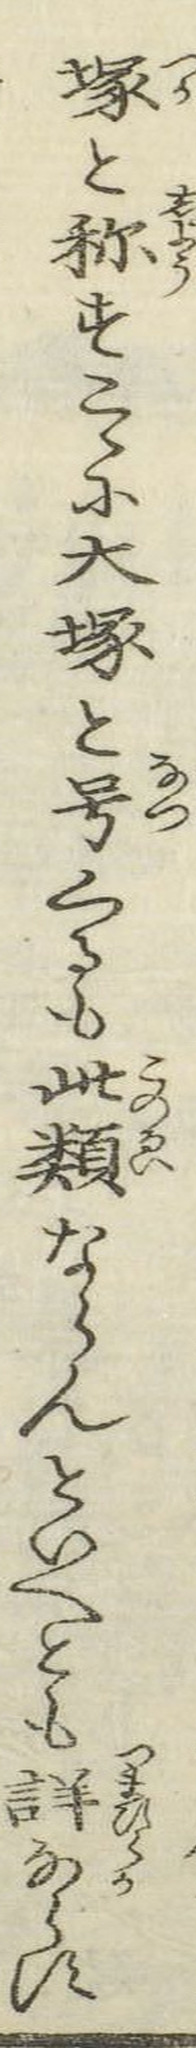塚と称すこゝに大塚と号くるも此類ならんといへとも詳ならす
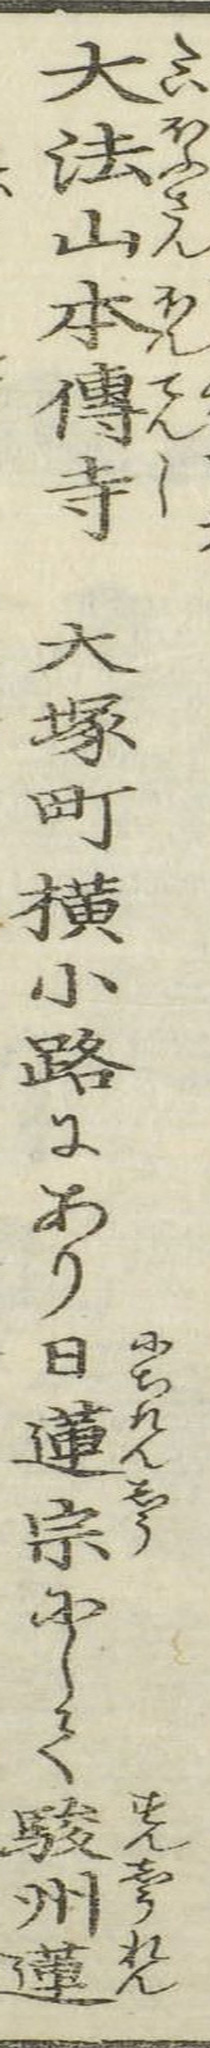大法山本傳寺大塚町横小路にあり日蓮宗にして駿州蓮
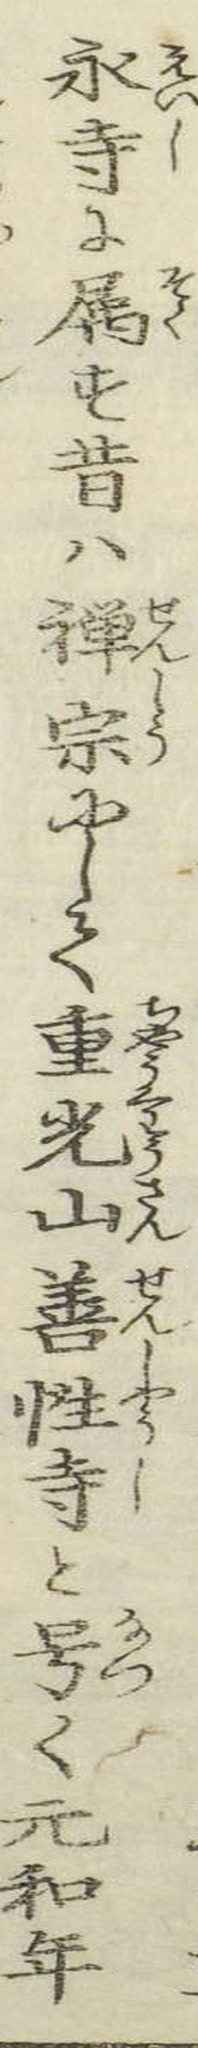永寺に属す昔は禅宗にして重光山善性寺と号く元和年
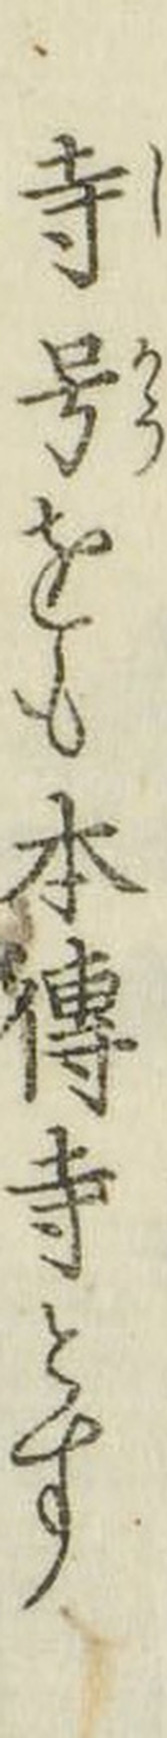寺号をも本傳寺とす
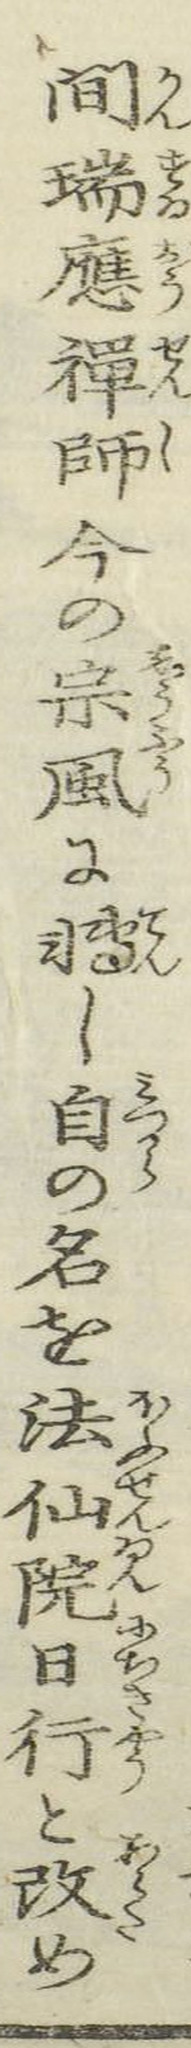間瑞應禪師今の宗風に轉し自の名を法仙院日行と改め
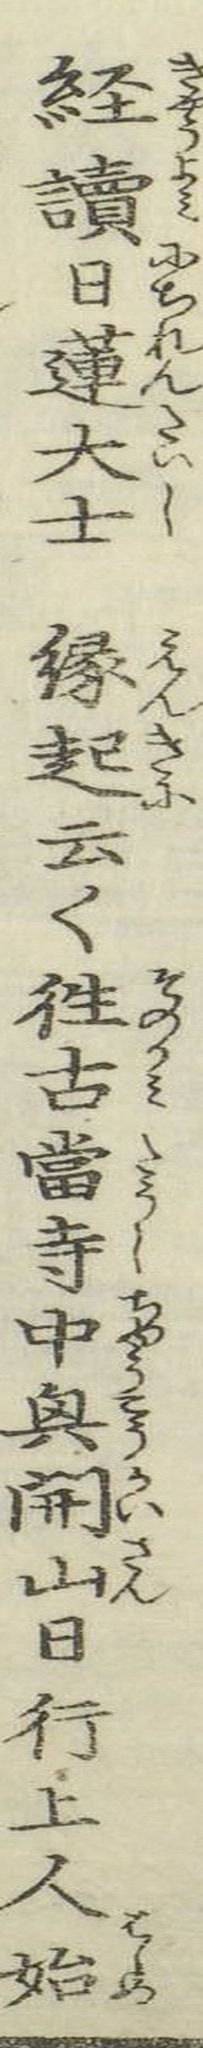経讀日蓮大士縁起云く往古當寺中興開山日行上人始
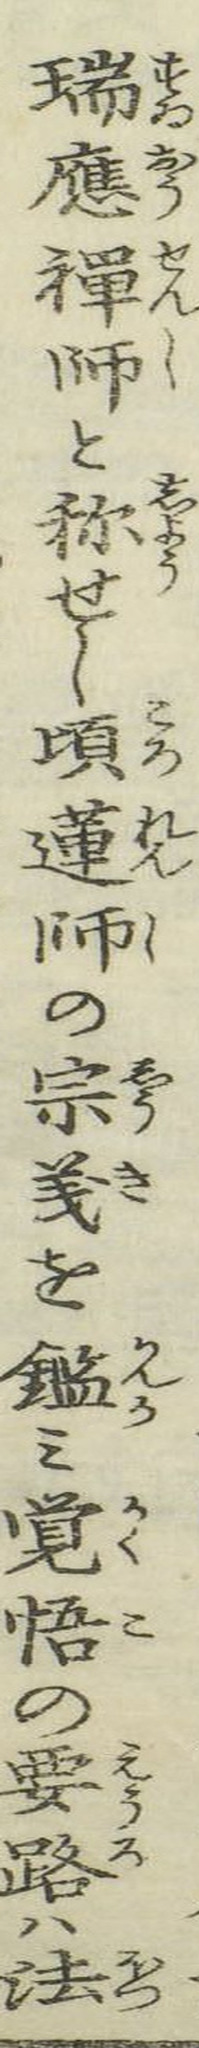瑞應禪師と称せし頃蓮師の宗義を鑑み覚悟の要路は法
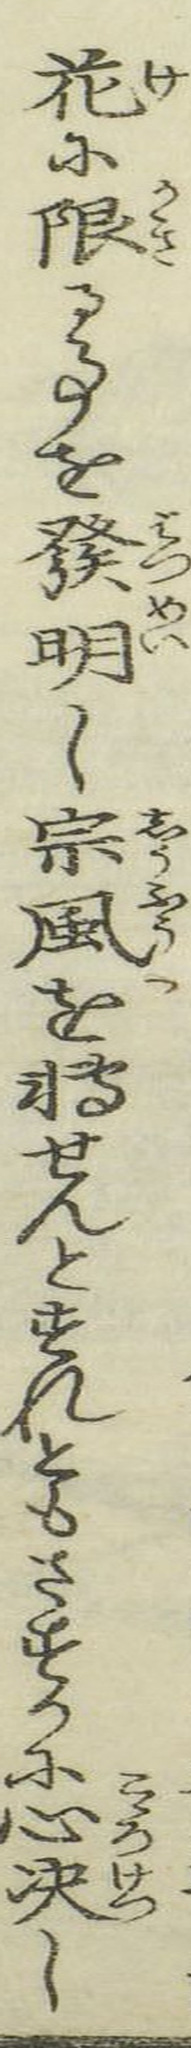花に限る事を發明し宗風を轉せんとすれともさすかに心决し

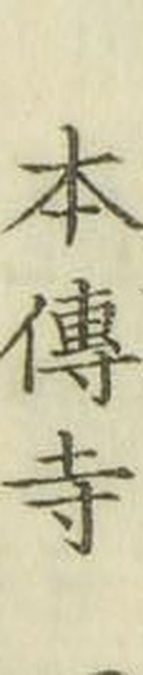本傳寺

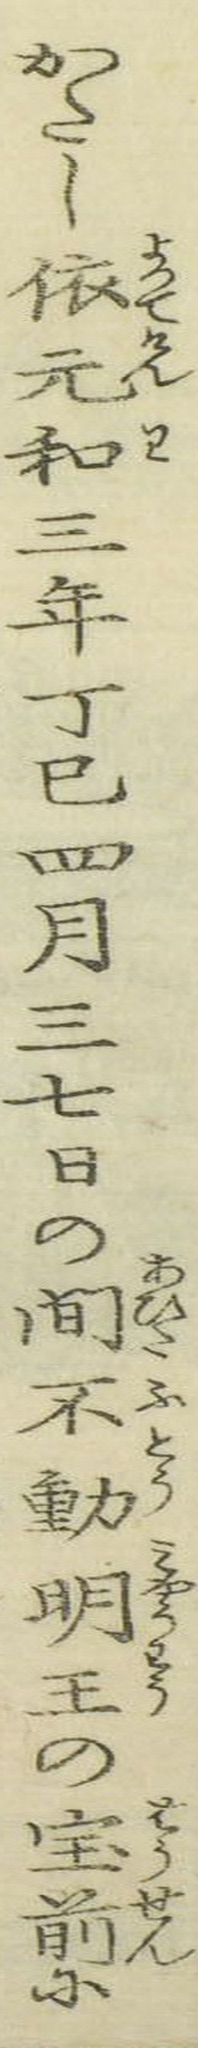かたし依元和三年丁巳四月三七日の間不動明王の宝前に
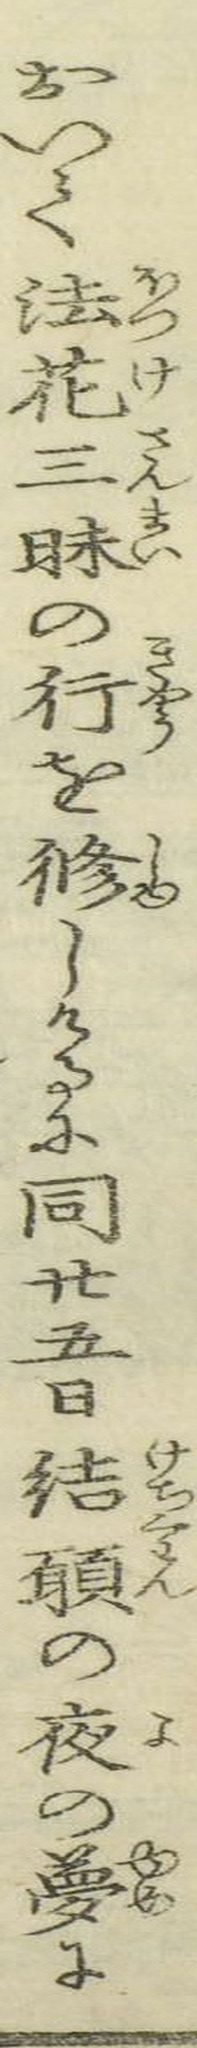おいて法花三昧の行を修しけるに同廿五日結願の夜の夢に
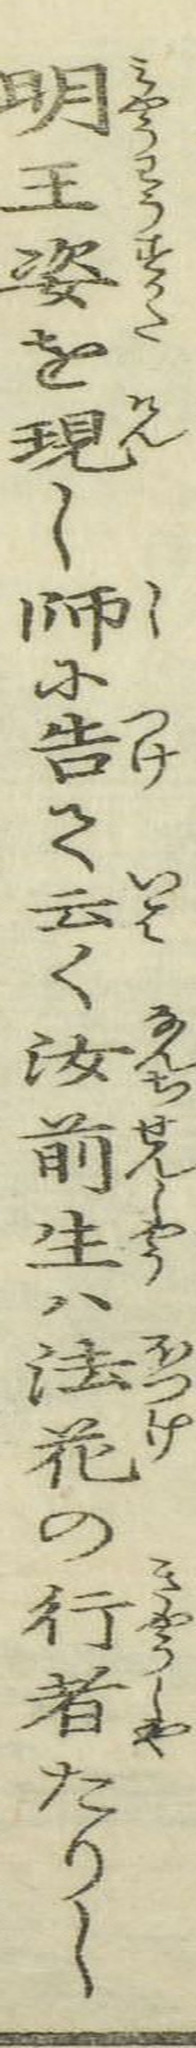明王姿を現し師に告て云く汝前生は法花の行者たりし
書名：江戸名所図会 20巻 巻之12
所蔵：東京学芸大学教育コンテンツアーカイブ
